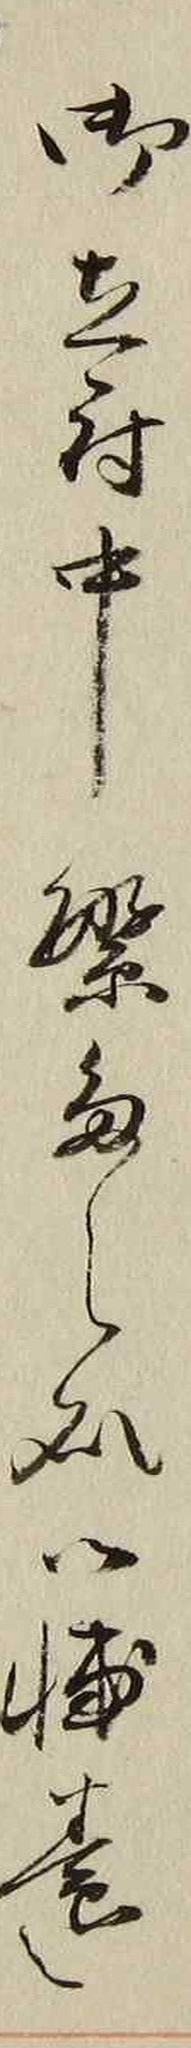御在府繁多之処御輔養之
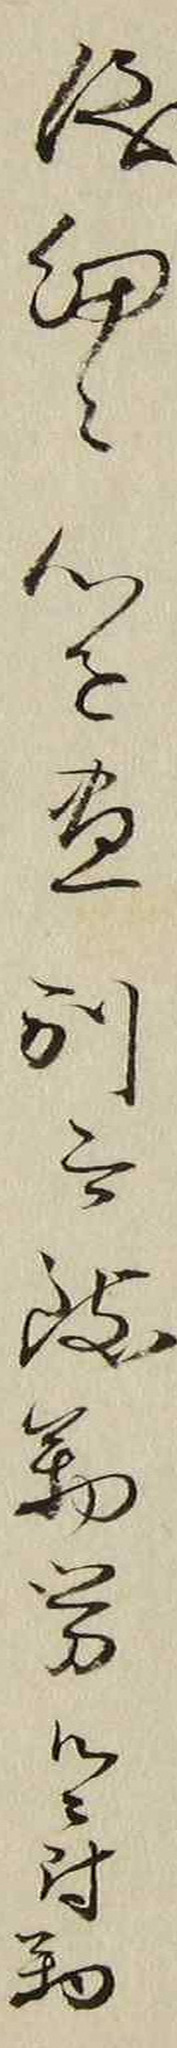儀細々心を尽別而致勤労候に付勤
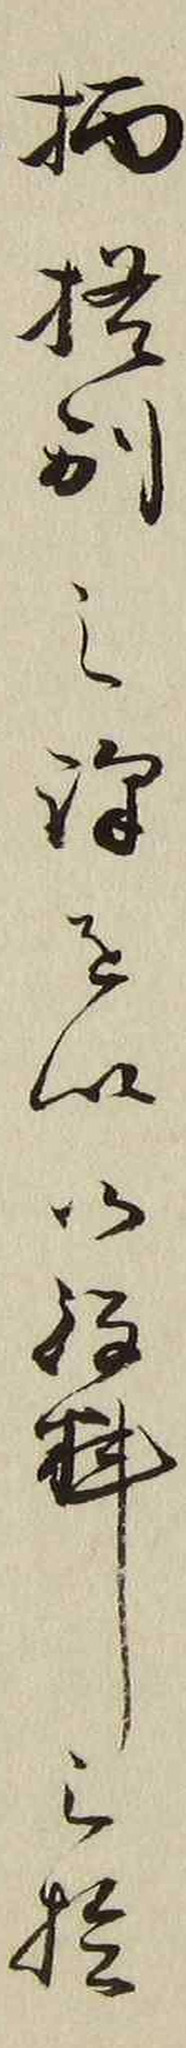柄格別之譯を以御役料三拾
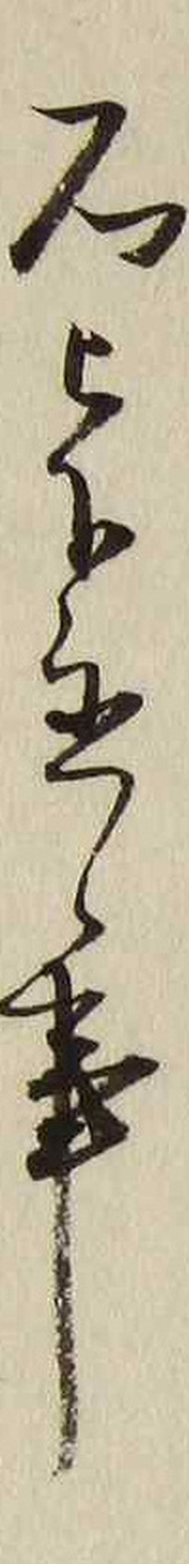石被下置候事
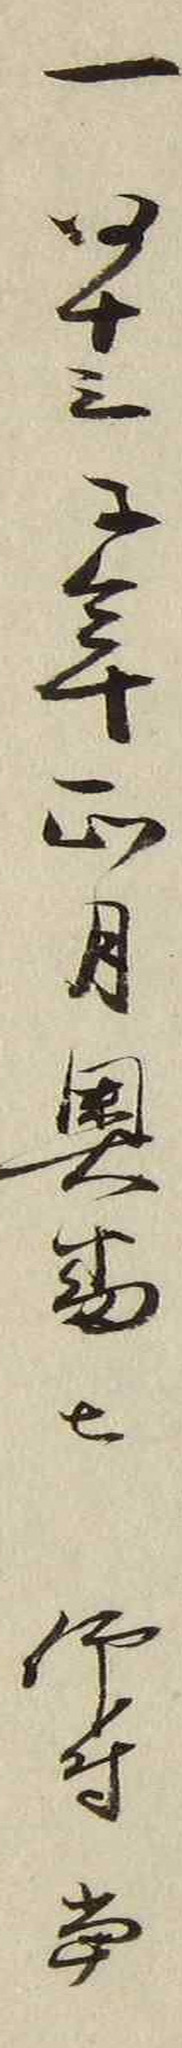一同十三子年正月奥番被仰付当
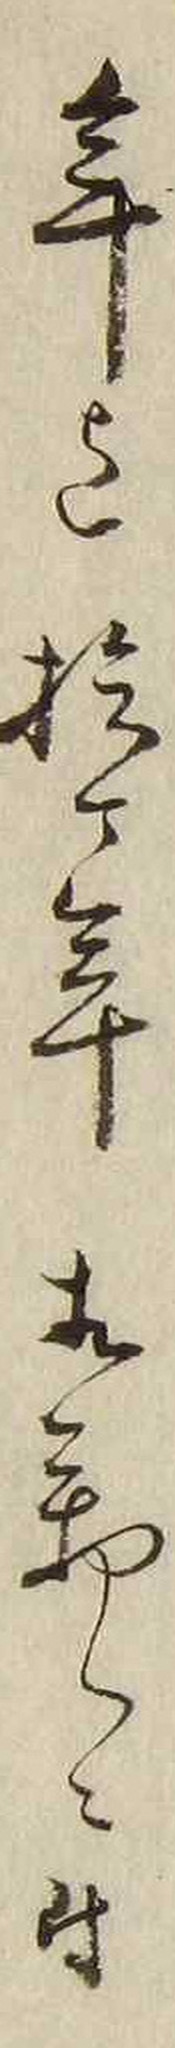年迄拾ヶ年相勤候に付

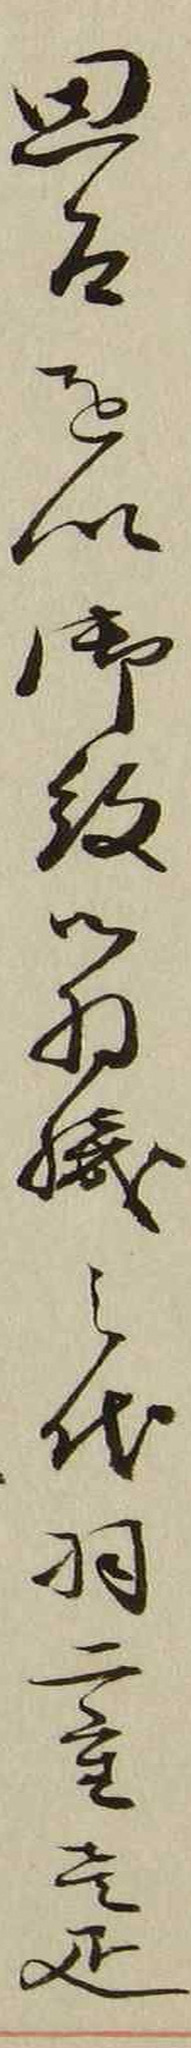思召を以御紋御羽織之代羽二重壱疋
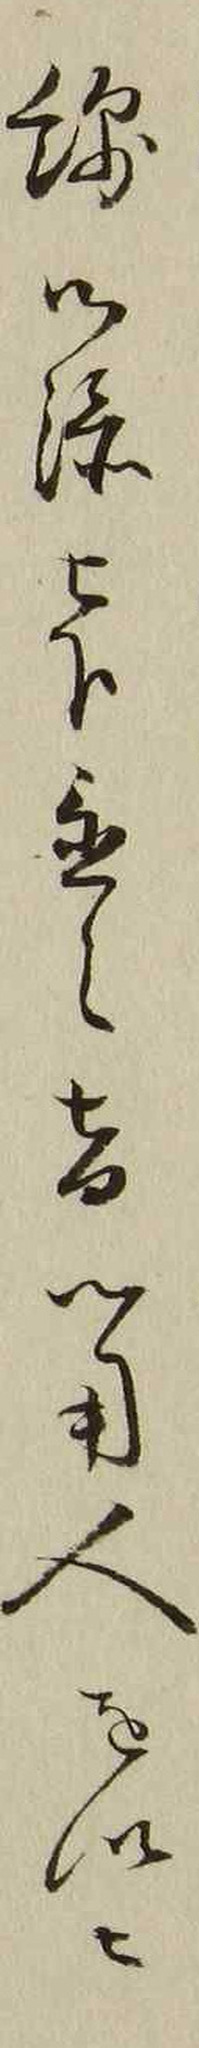綿御添被下置之旨御用人を以被
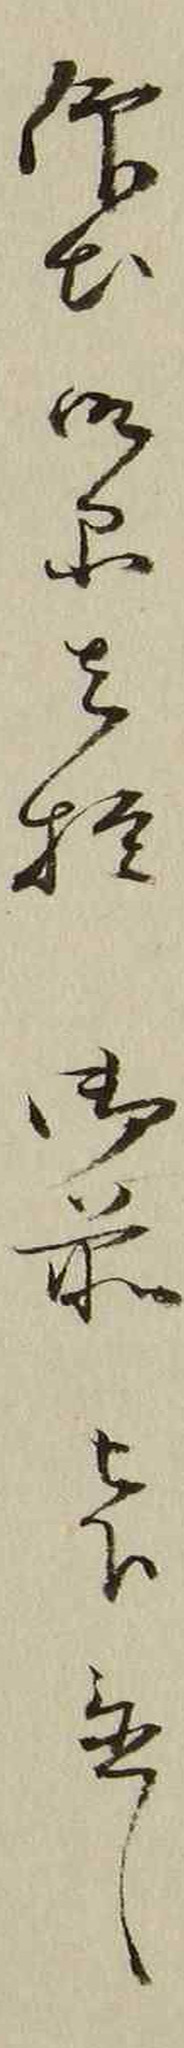仰出御品は於御前被下置候
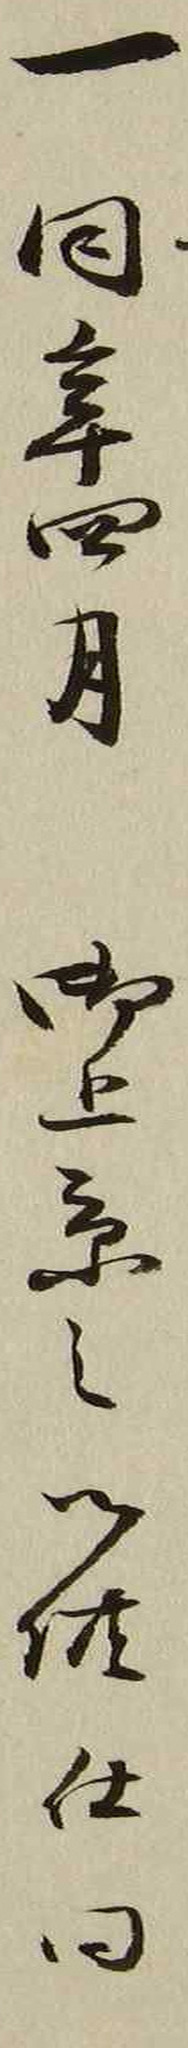一同年四月御上京之御供仕同
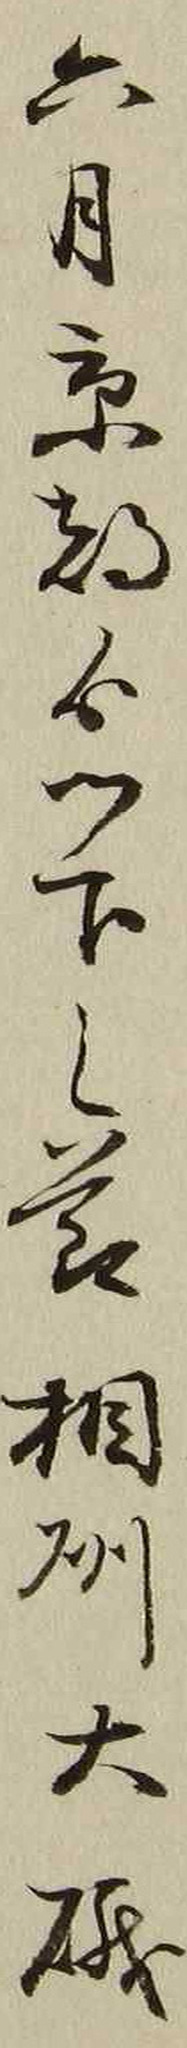六月京都ゟ御下之節相州大磯
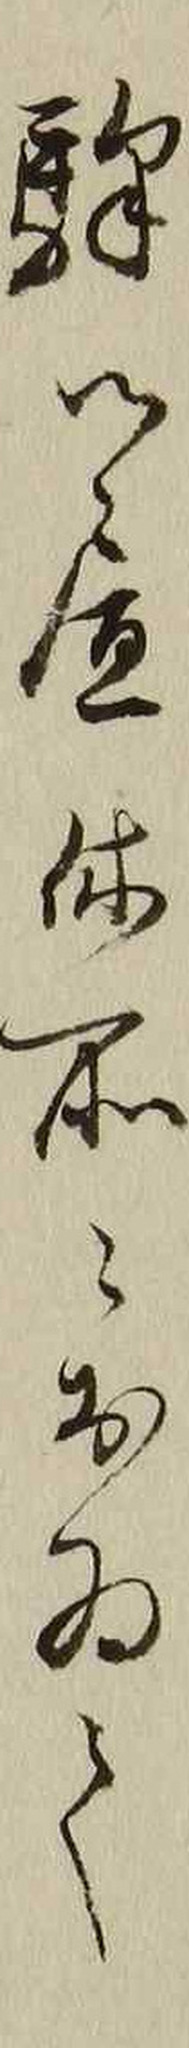駅御昼休所におゐて
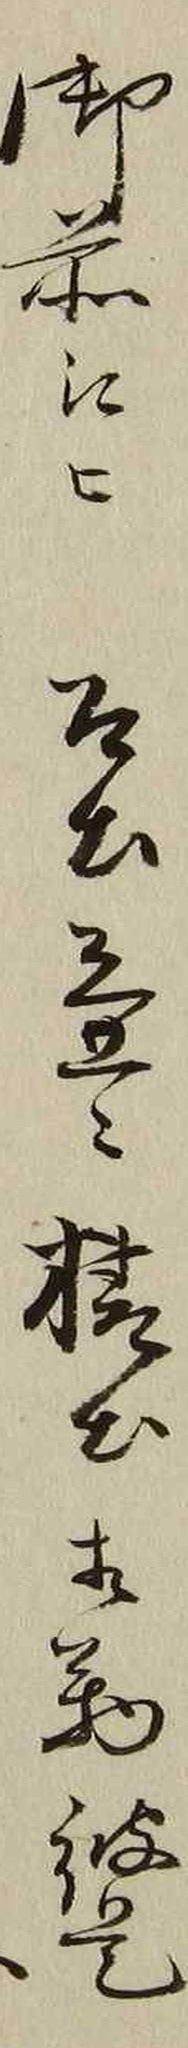御前江被召出兼而精出相勤彼是
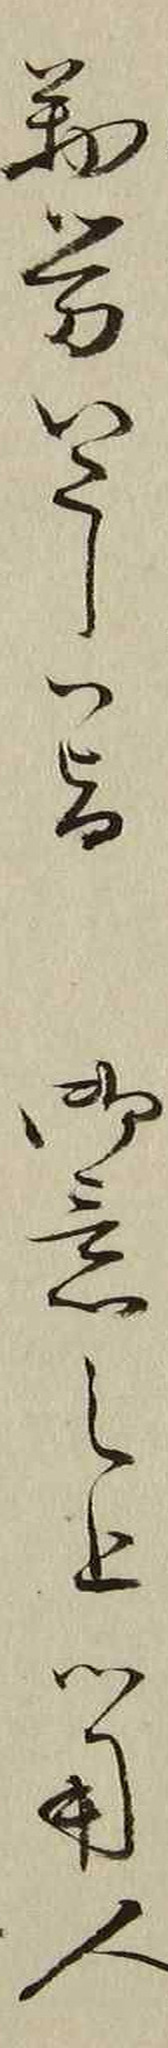勤労いたし候旨御意之上御用人
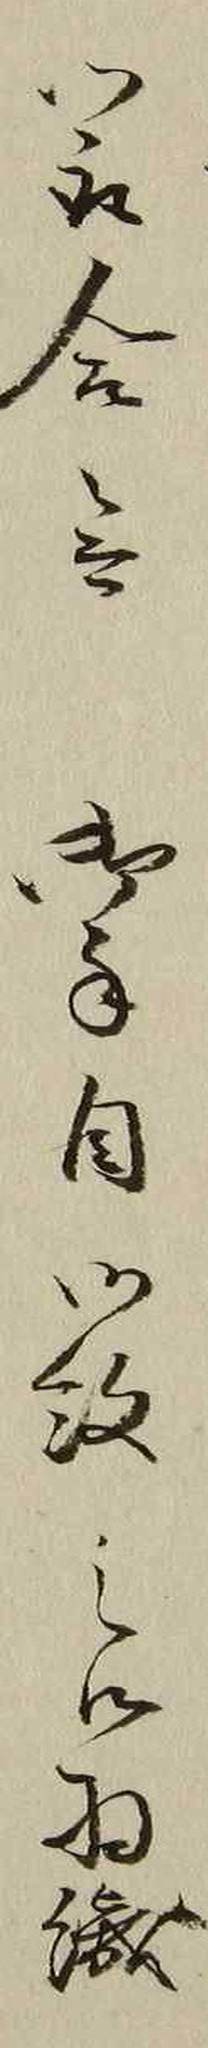御取合に而御手自御紋之御羽織
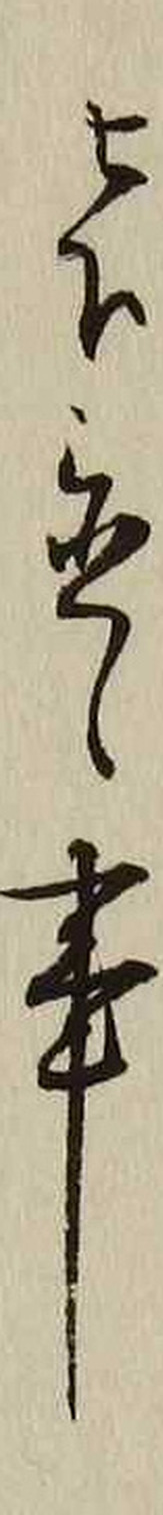被下置候事
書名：諸士系譜　巻之292　き之部1
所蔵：会津若松市立会津図書館
